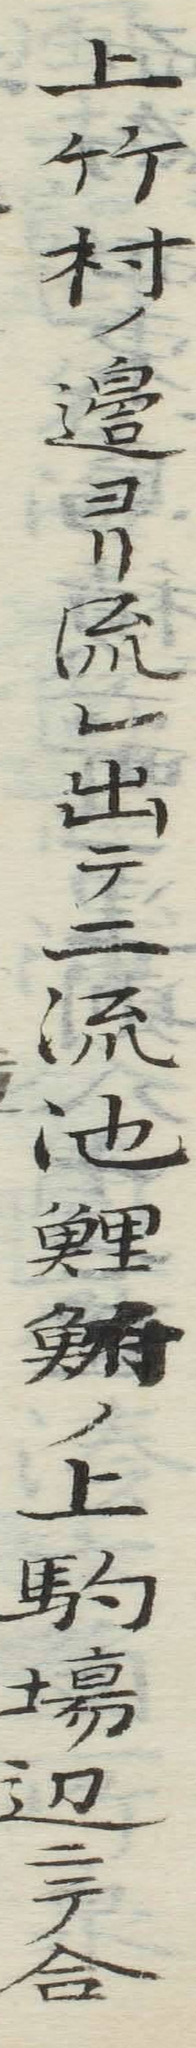上竹村ノ邉ヨリ流レ出テ二流池鯉鮒ノ上駒場辺ニテ合
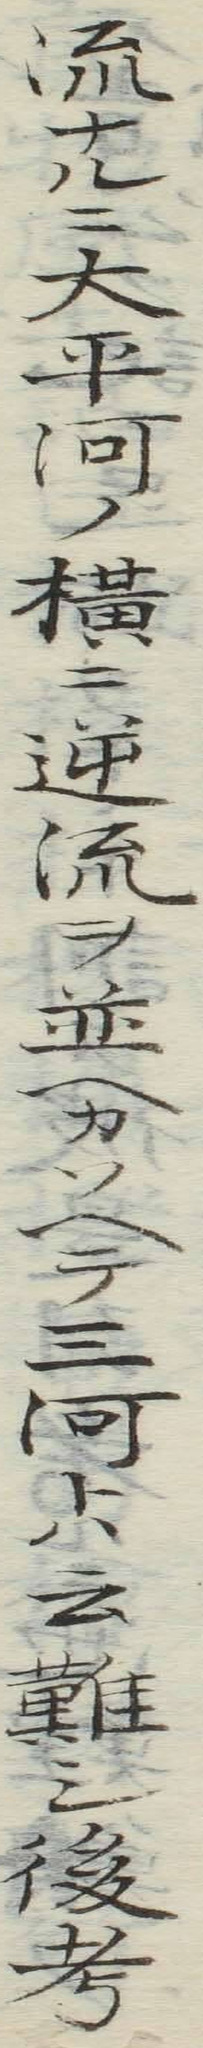流ナルニ大平河ノ横ニ逆流ヲ並ヘカソヘテ三河トハ云難シ後考
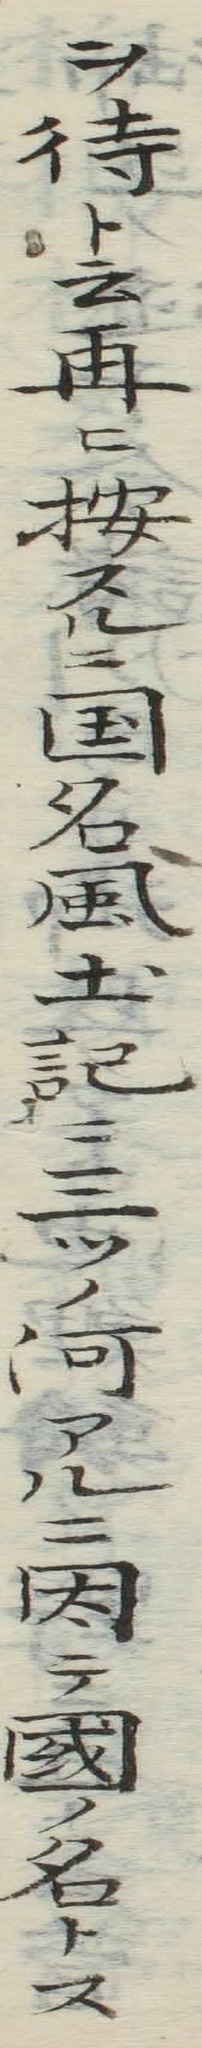ヲ待ト云再ヒ按スルニ国名、風土記ニ三ツノ河アルニ因テ國ノ名トス
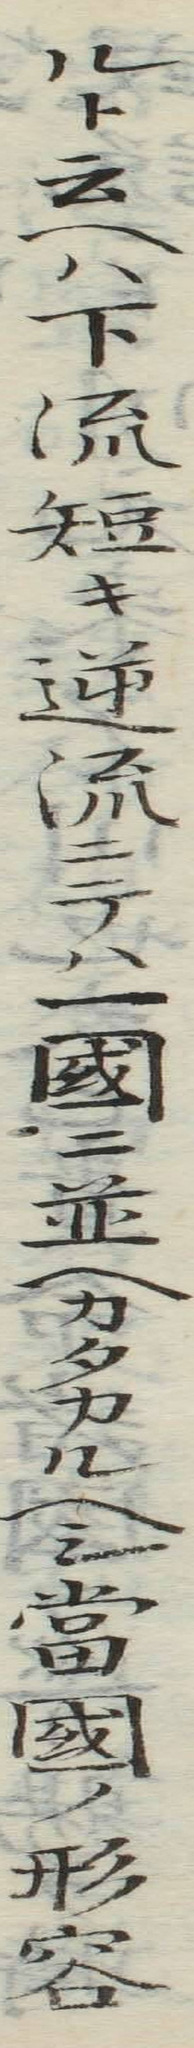ルト云ヘハ下流短キ逆流ニテハ一國ニ並ヘカタカルヘシ當國ノ形容
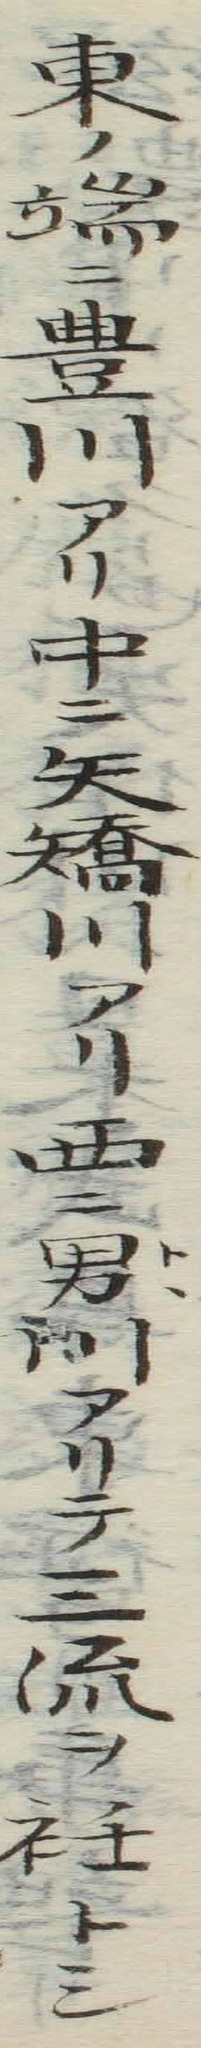東ノ端ニ豊川アリ中ニ矢矯川アリ西ニ男川アリテ三流ヲ衽トシ
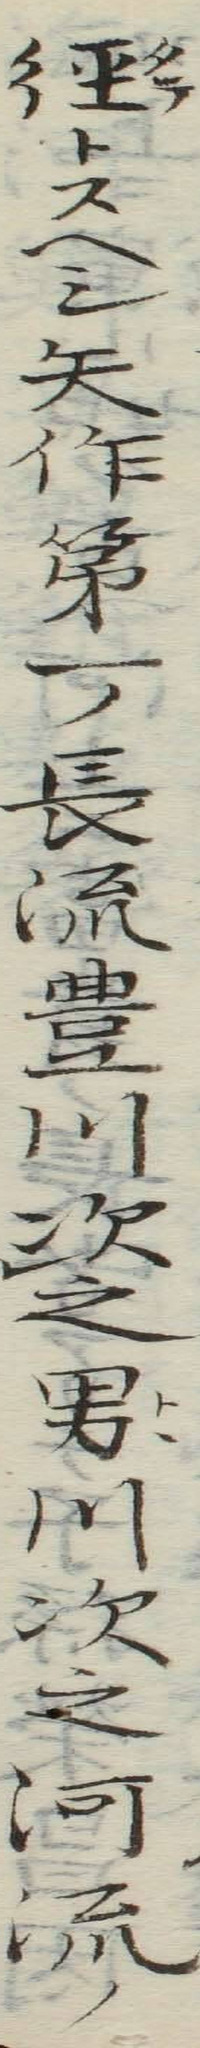經トスヘシ矢作第一ノ長流豊川次之男川次之河流ノ
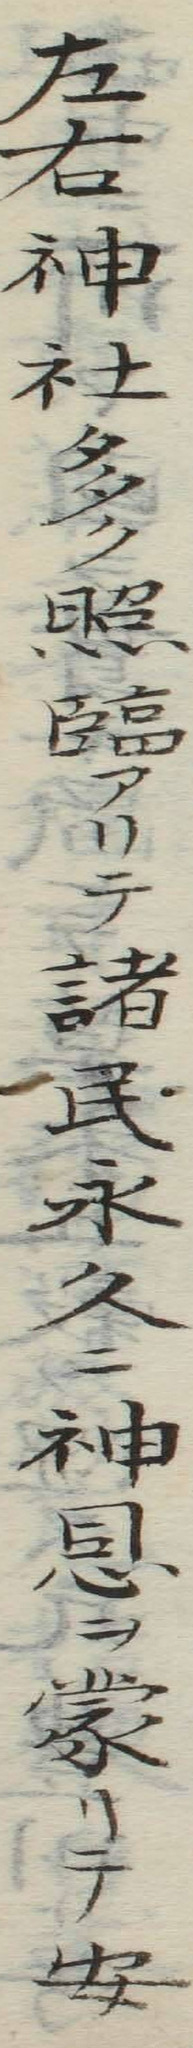左右神社多ク照臨アリテ諸民永久ニ神恩ヲ蒙リテ安
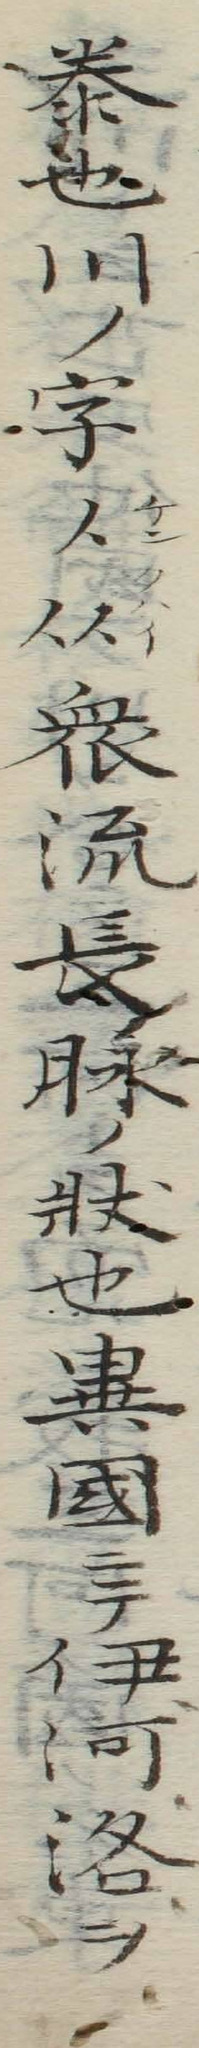泰也川ノ字人从衆流長脉ノ狀也異國ニテ伊、河、洛、ヲ

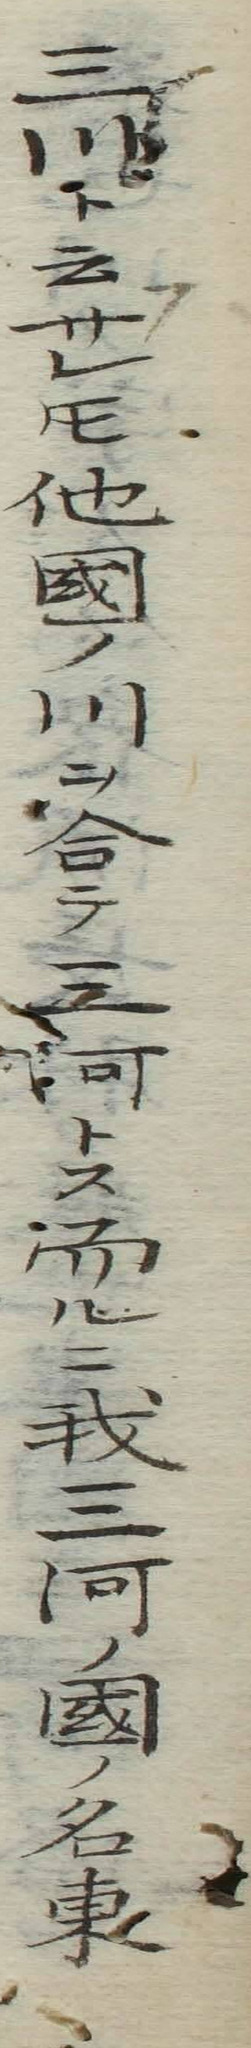三川ト云フサレトモ他國ノ川ヲ合テ三河トス而ルニ我三河ノ國ノ名東
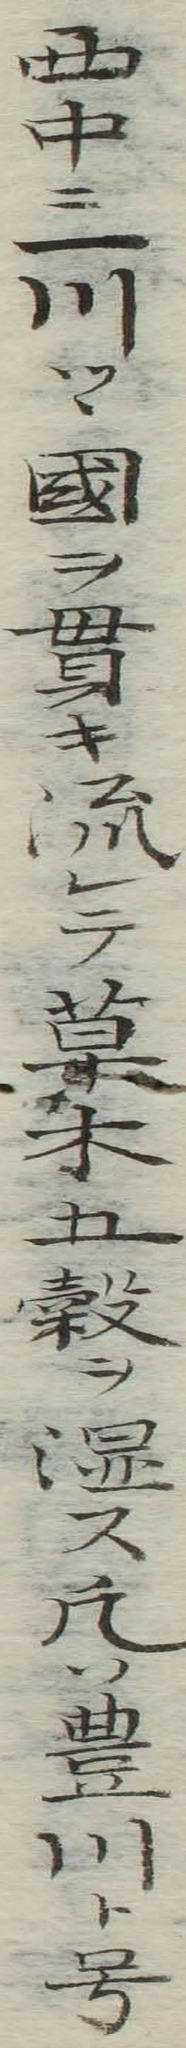西中ニ一川ツヽ國ヲ貫キ流レテ草木五穀ヲ湿ス凡ソ豊川ト号
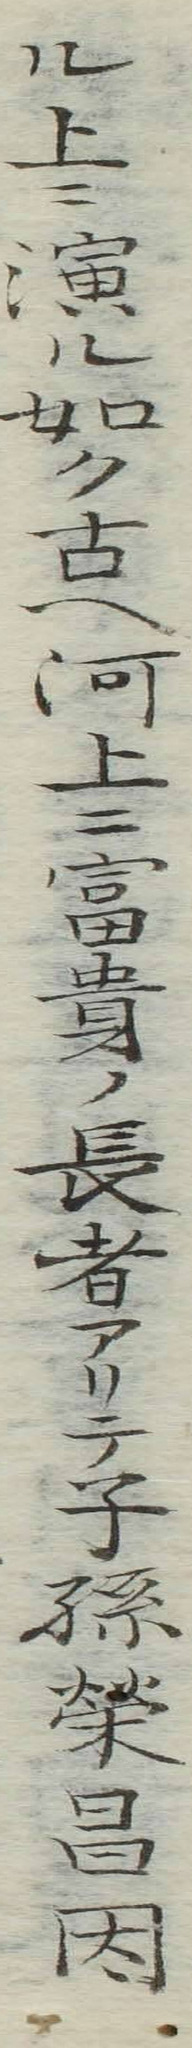ル上ニ演ル如ク古ヘ河上ニ富貴ノ長者アリテ子孫營昌因
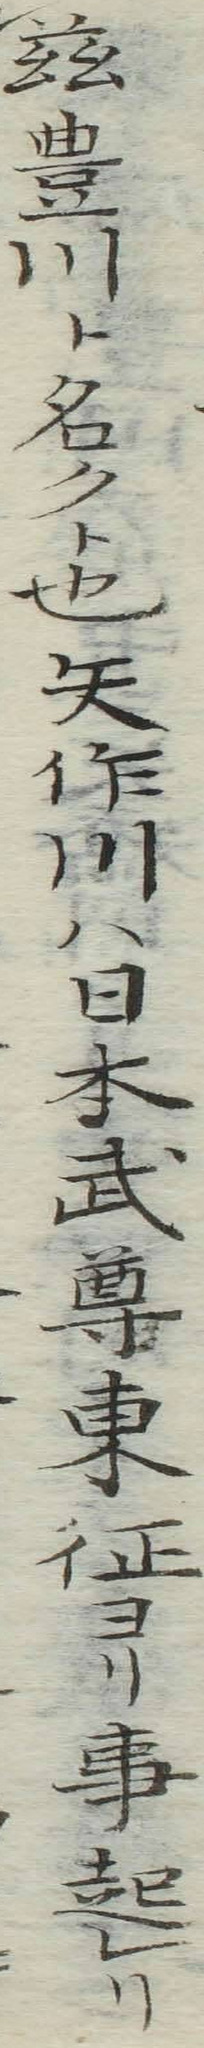茲豊川ト名クト也矢作川ハ日本武尊東征ヨリ事起レリ
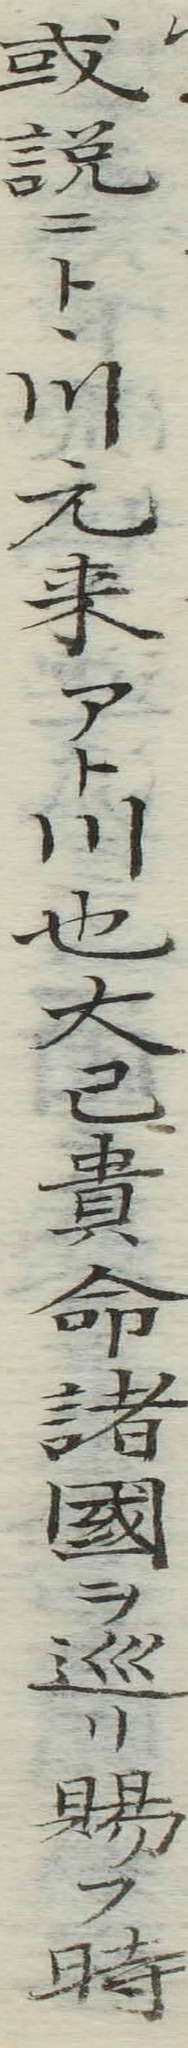或説ニトヽ川元来アト川也大己貴命諸国ヲ巡リ賜フ時
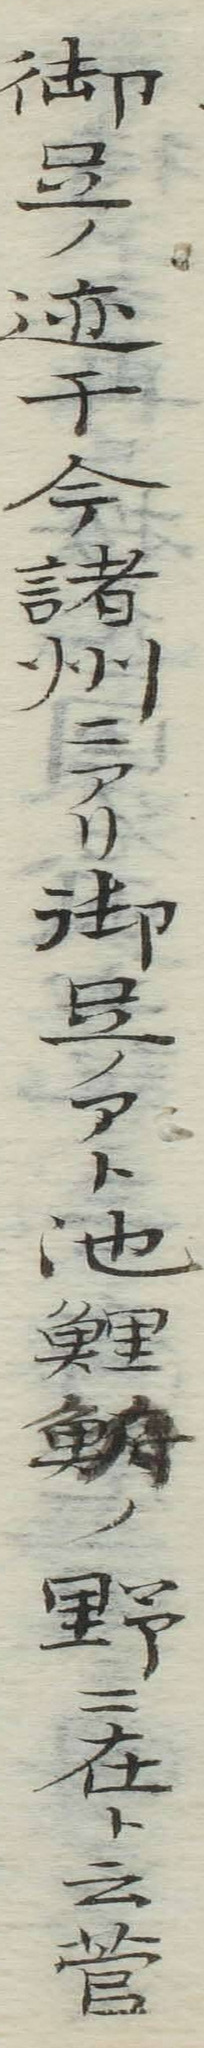御足ノ迹于今諸州ニアリ御足ノアト池鯉鮒ノ野ニ在ト云菅
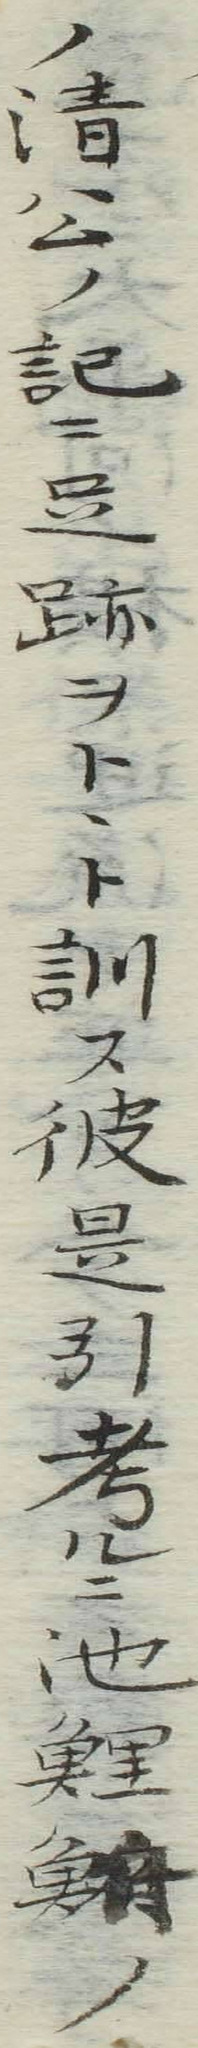ノ清公ノ記ニ足跡ヲトヽト訓ス彼是引考ルニ池鯉鮒ノ
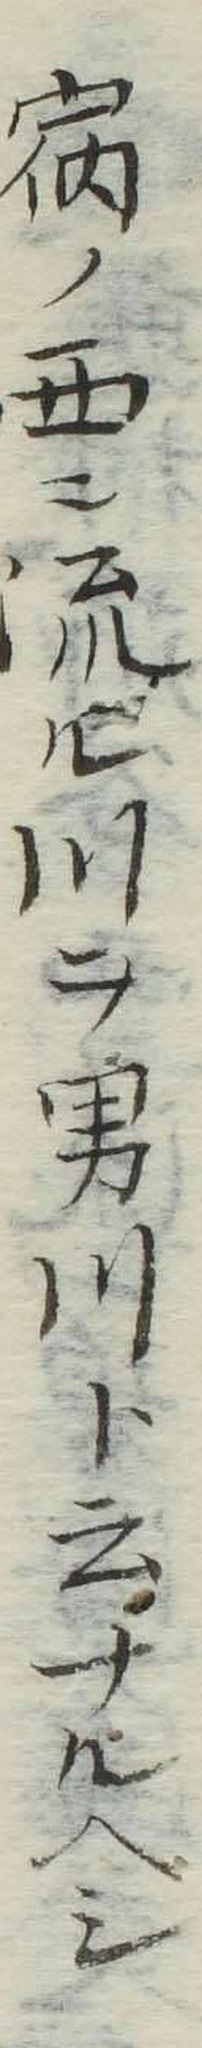宿ノ西ニ流ル川ヲ男川ト云ナルヘシ
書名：三河国二葉松
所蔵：国文学研究資料館
